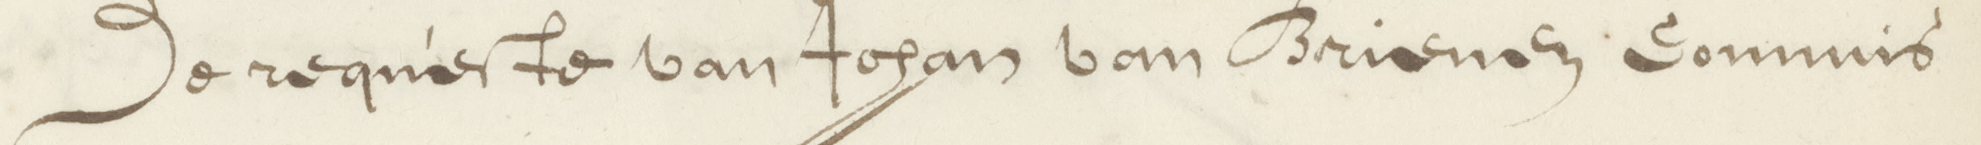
De requeste van Johan van Brienen Commies
